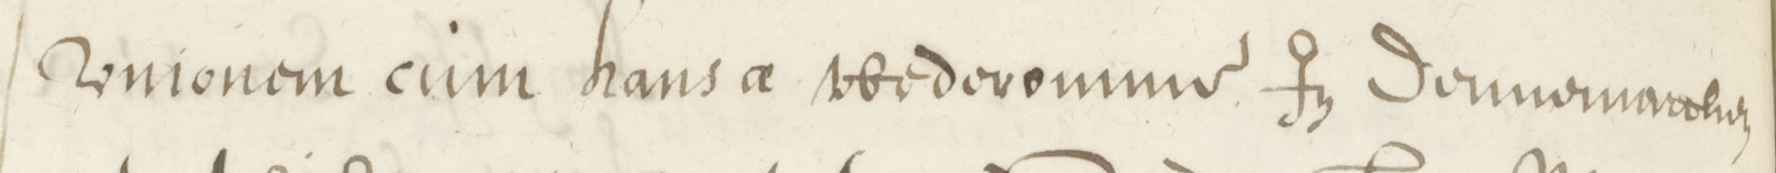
Unionem cum hansa wederomme In Dennemarcken
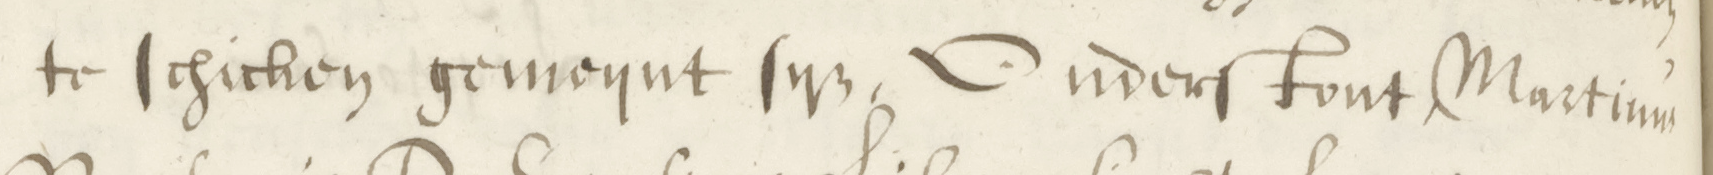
te schicken gemeynt syn. Onderstont Martinus
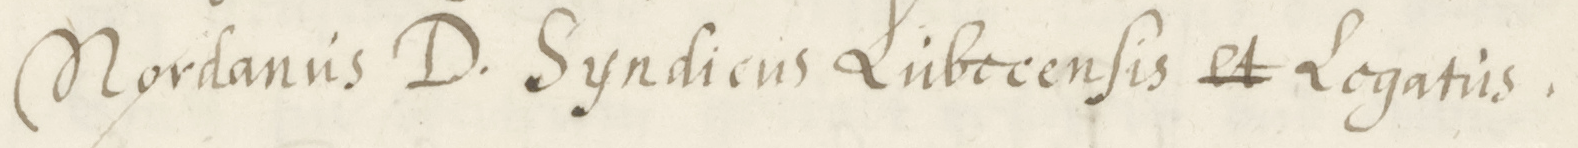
Nordanus D. Syndicus Lubecensis et Legatus.
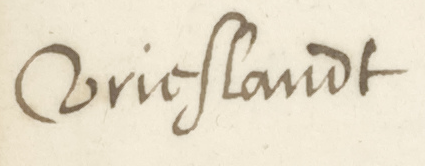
Vrieslandt
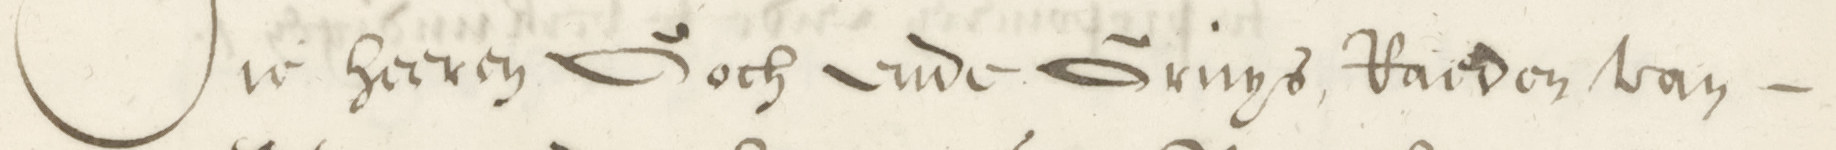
Die heeren Goch ende Gruys, Raeden van -
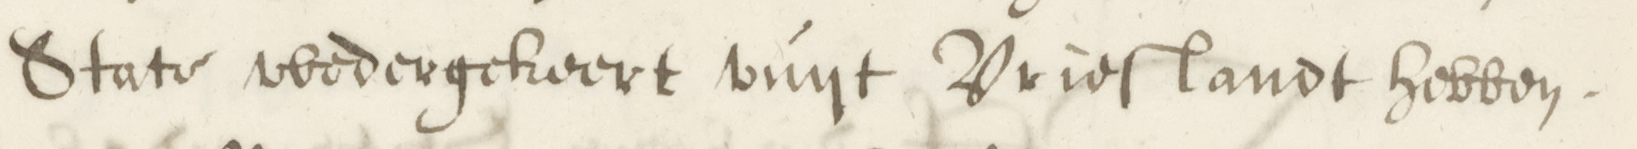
State wedergekeert vuyt Vrieslandt hebben
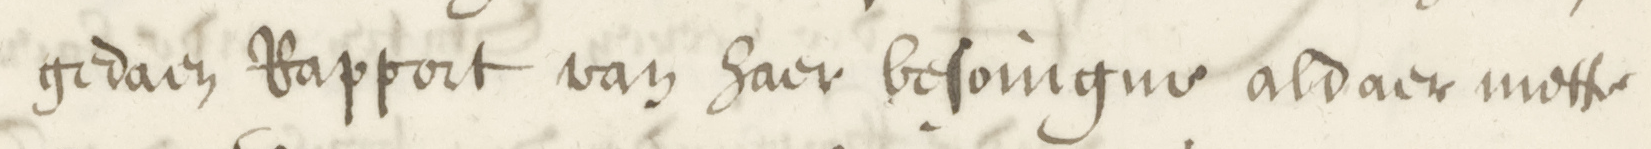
gedaen Rapport van haer besoingne aldaer mette
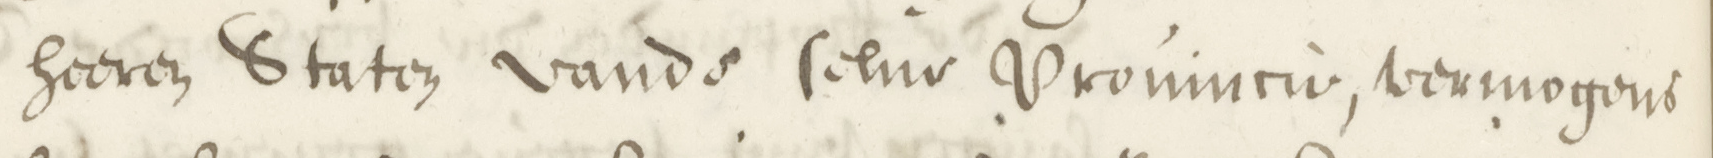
heeren Staten vande selue Prouincie, vermogens
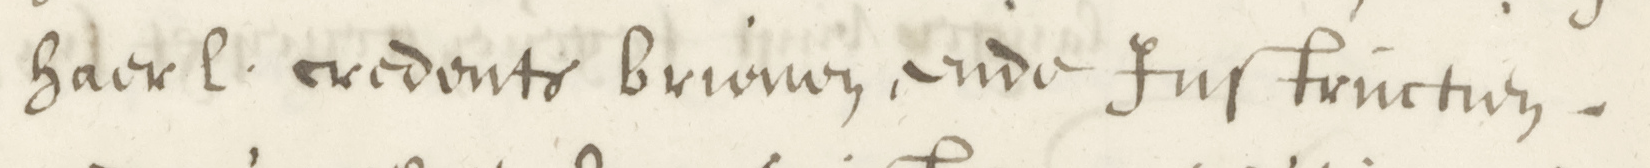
haer L. credents brieuen, ende Instructien
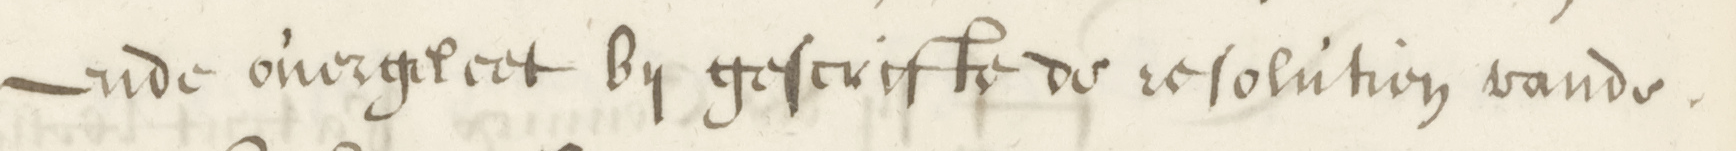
ende ouergeleet by gescrifte de resolutien vande
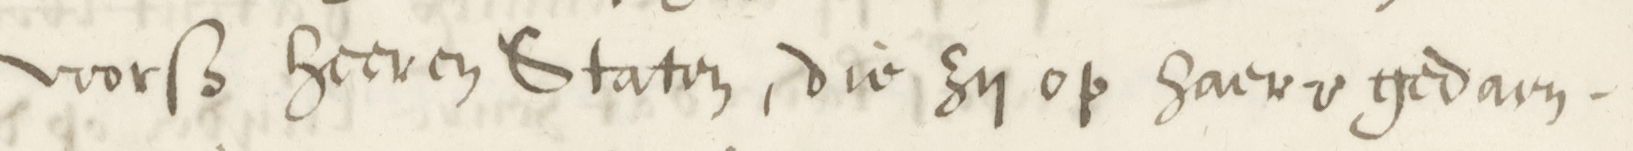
voors heeren Staten, die zy op haere gedaen
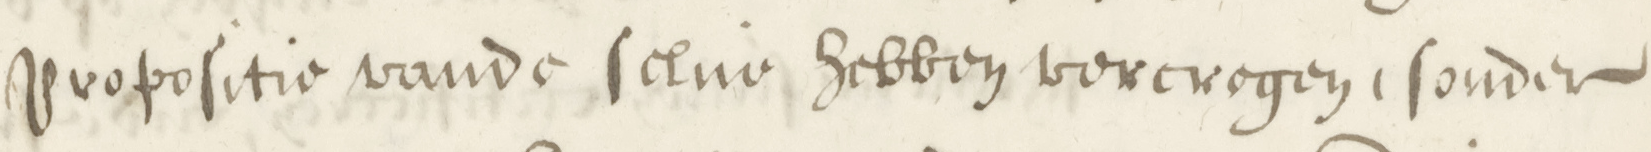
propositie vande selue hebben vercregen, sonder
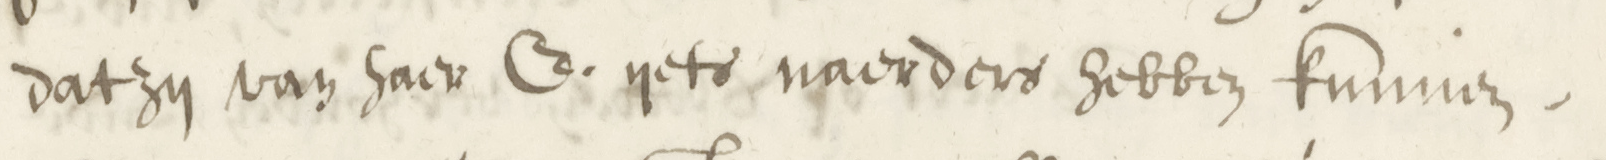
dat zy van haer E. yets naerders hebben kunnen
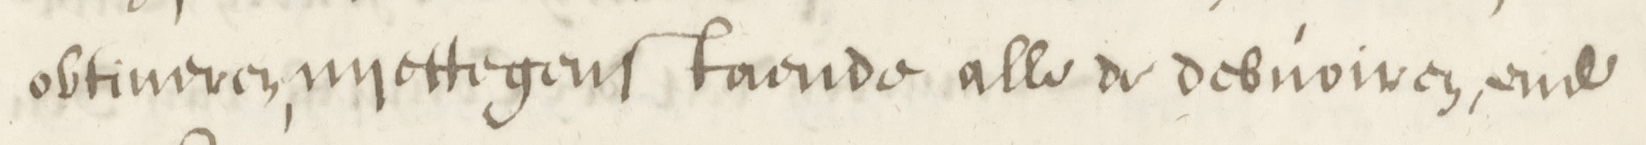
obtineren nyettegenstaende alle de debuoiren, ende
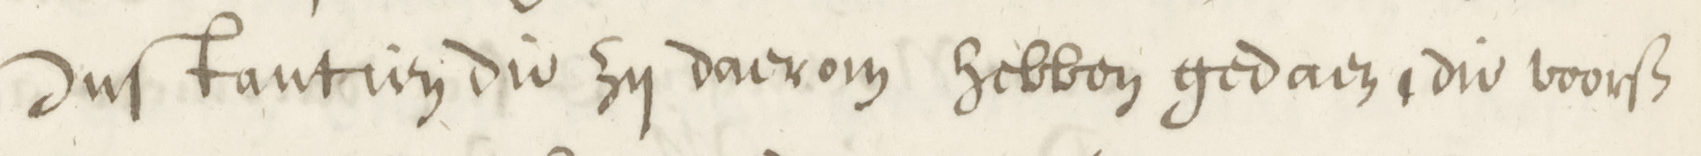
Instantien die zy daerom hebben gedaen. die voors
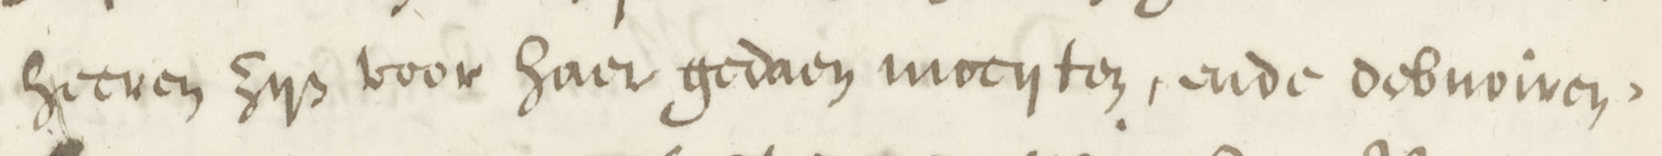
heeren zyn voor haer gedaen moeyten, ende debuoiren
